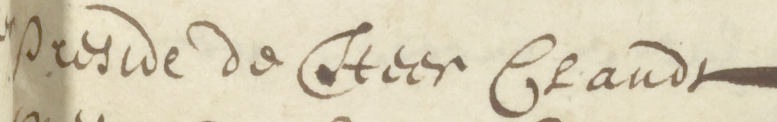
Preside de Heer Clandt
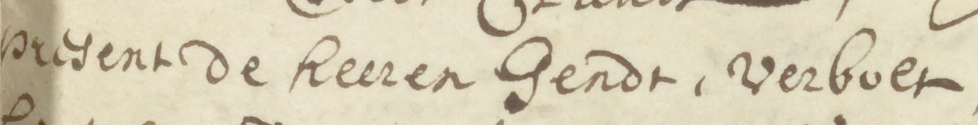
present de heeren Gendt, Verbolt,
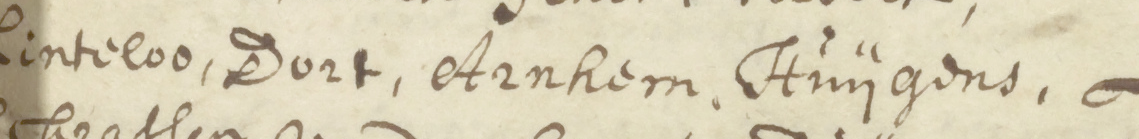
Linteloo, Dort, Arnhem, Huijgens, —
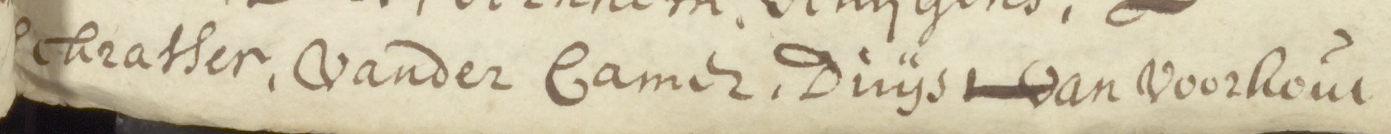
Schrasser, vander Camer, Duijst van Voorhout.
